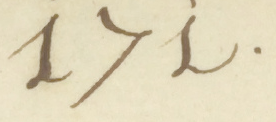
171
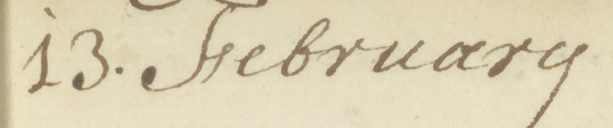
13. Februarij
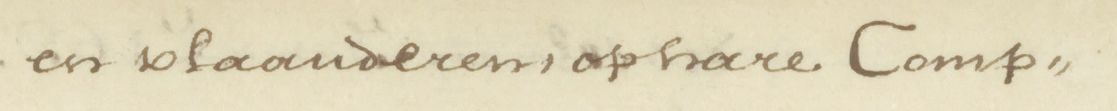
en Vlaanderen op hare Comp„
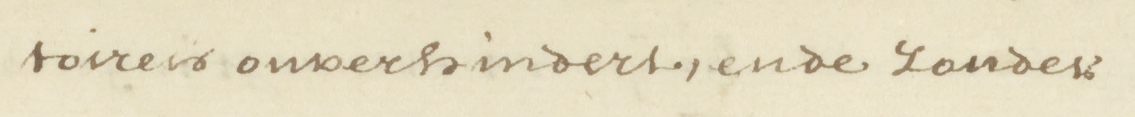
toiren onverhindert ende zonder
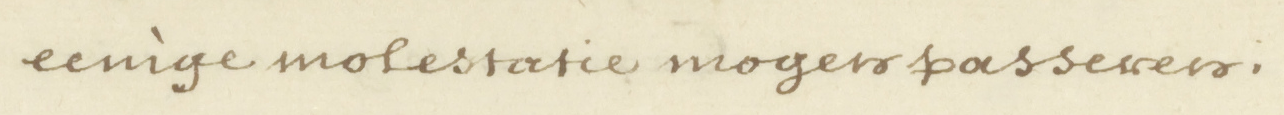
eenige molestatie mogen passeren.
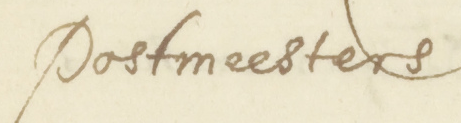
Postmeesters
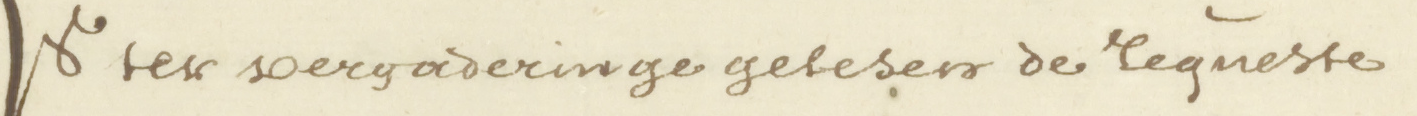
Is ter vergaderinge gelesen de requeste
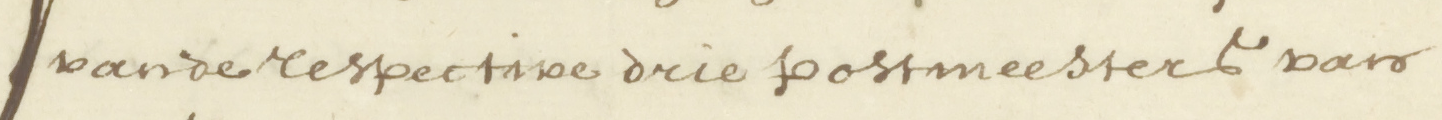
van de respective drie postmeesters van
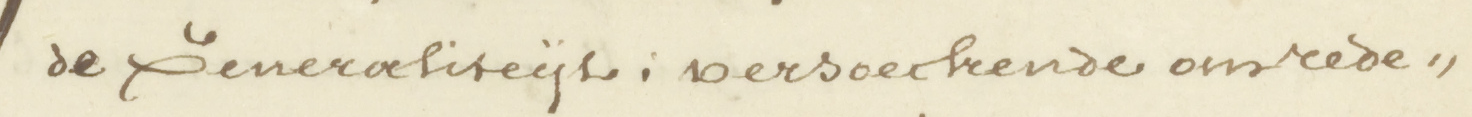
de Generaliteijt, versoeckende om rede„
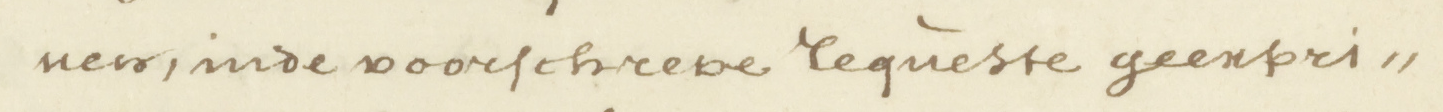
nen inde voorschreve requeste geexpri„
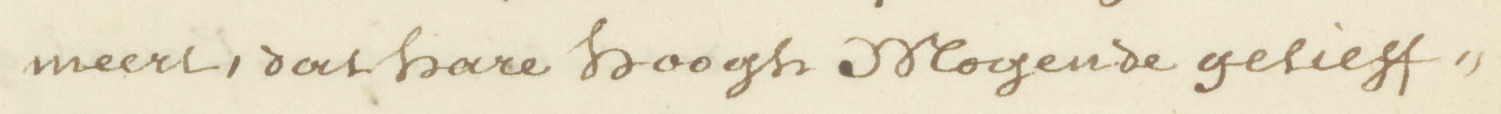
meert, dat hare Hoogh Mogende gelieff„
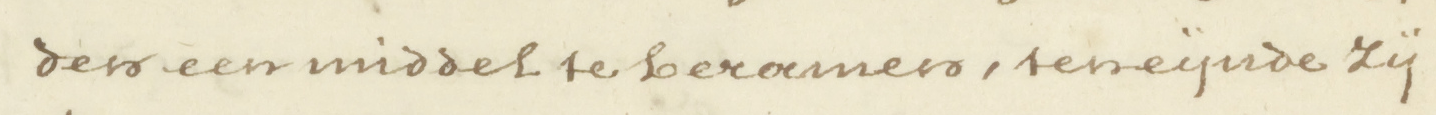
den een middel te beramen, teneijnde zij
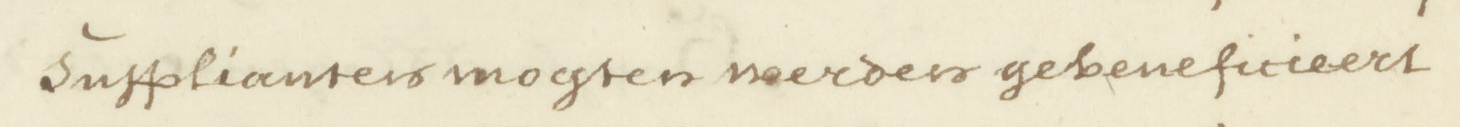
Supplianten mogten werden gebeneficieert
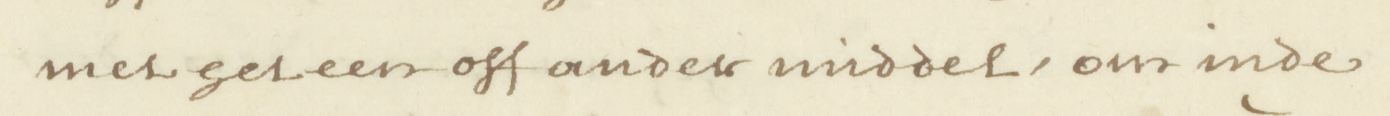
met het een off ander middel, om inde
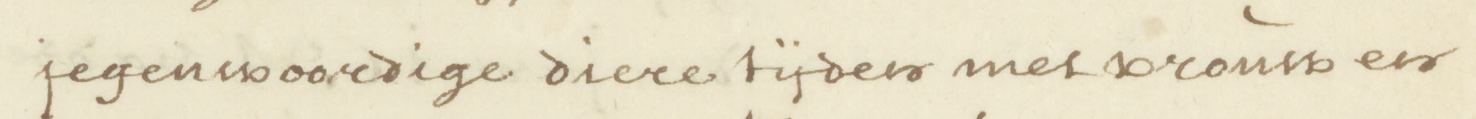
jegenwoordige diere tijden met vrouw en
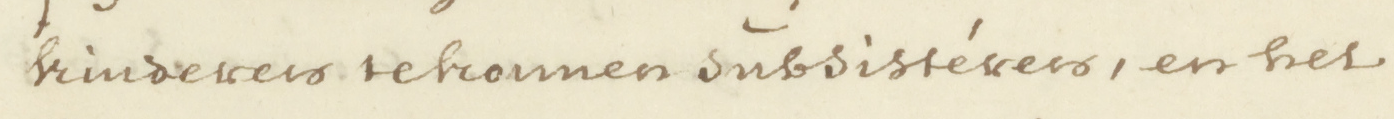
kinderen te konnen subsisteren, en het
